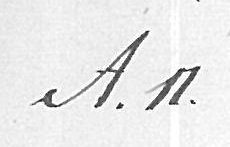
A. 11.
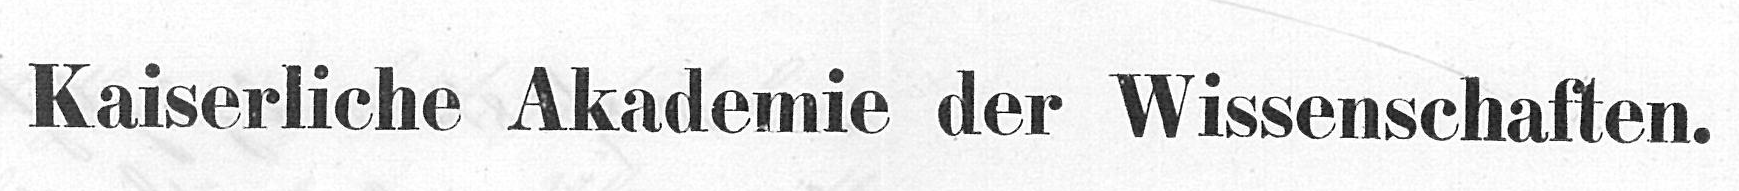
Kaiserliche Akademie der Wissenschaften.
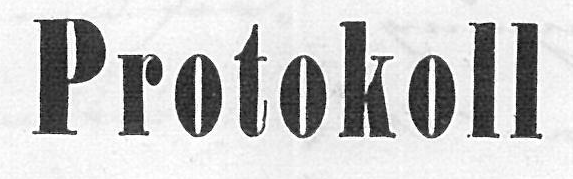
Protokoll
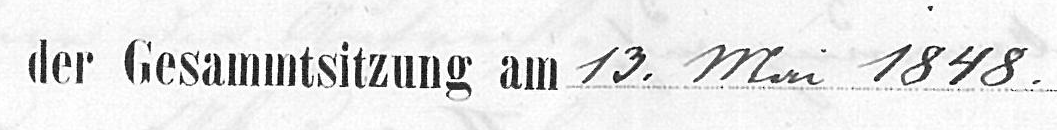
der Gesammtsitzung am 13. Mai 1848.
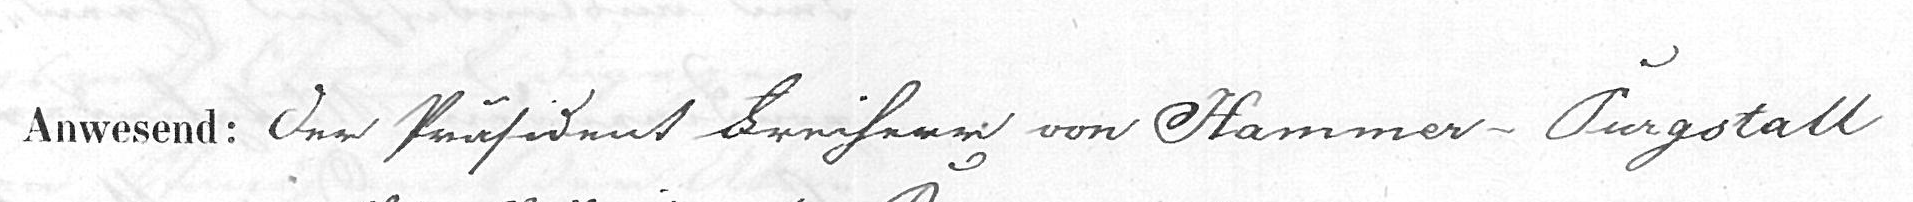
Anwesend: Der Präsident Freiherr von Hammer-Purgstall
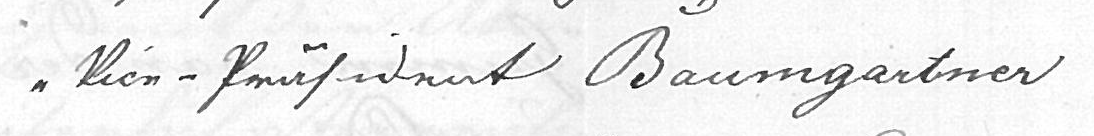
" Vice-Präsident Baumgartner
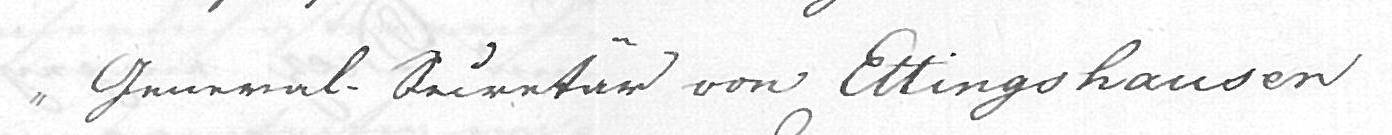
"General-Secretär von Ettingshausen
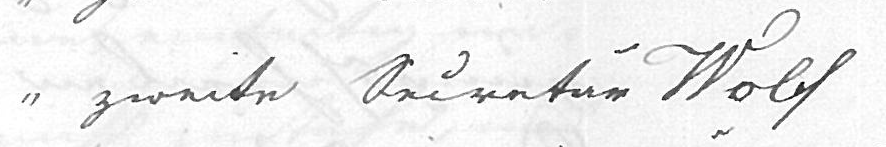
"zweite Secretär Wolf
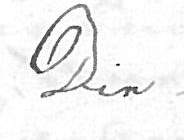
Die
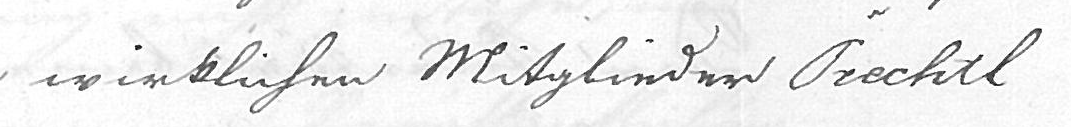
wirklichen Mitglieder Prechtl
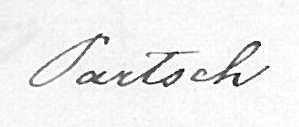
Partsch
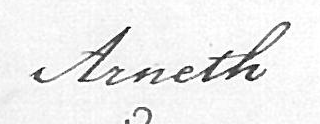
Arneth
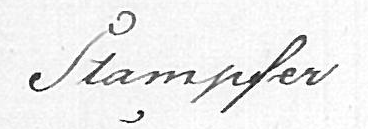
Stampfer
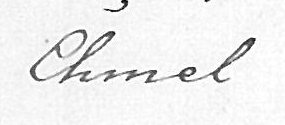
Chmel
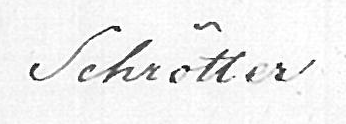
Schrötter
